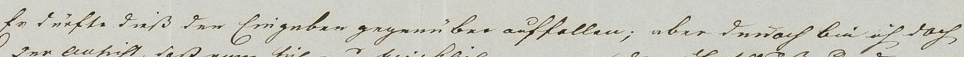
Es dürfte dieß den Eingaben gegenüber auffallen; aber dennoch bin ich doch
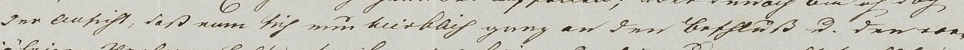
der Ansicht, daß man sich nun wirklich ganz an den Beschluß u. den vor-
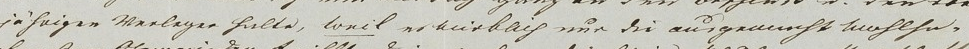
jährigen Verleger halte, weil es wirklich nur die ausgemacht wohlha-
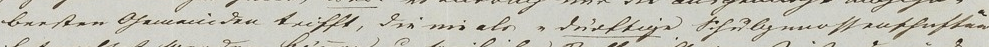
bensten Gemeinden trifft, die nie als «dürftige Schulgenossenschaften»
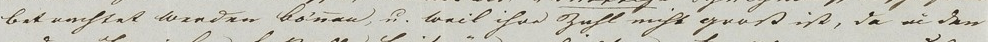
betrachtet werden können, u. weil ihre Zahl nicht groß ist, da in den
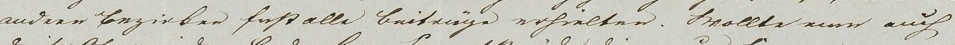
andern Bezirken fast alle Beiträge erhielten. Wollte man auch
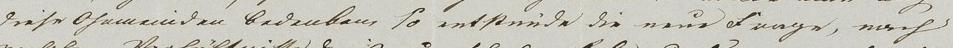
diese Gemeinden bedenken so entstünde die neue Frage, nach
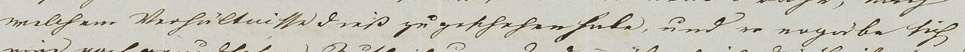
welchem Verhältnisse dieß zu geschehen habe, und es ergäbe sich
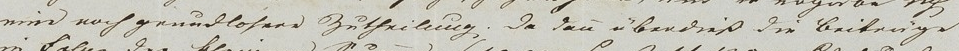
eine noch grundlosere Zutheilung. Da dann überdieß die Beiträge
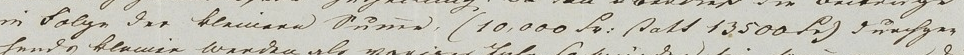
in Folge der kleinern Summe, (10,000 Fr: statt 13.500 Fr) durchge-
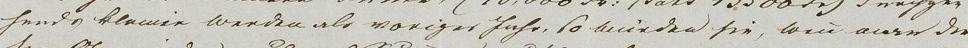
hends kleiner werden als voriges Jahr, so würden sie, wenn man die-
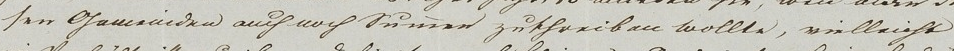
sen Gemeinden auch noch Summen zuschreiben wollte, vielleicht
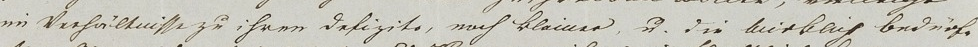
im Verhältnisse zu ihren Defizits, noch kleiner, u. die wirklich bedürf-
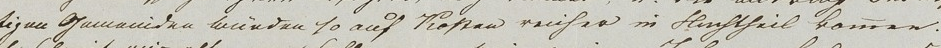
tigen Gemeinden würden so auf Kosten reicher in Nachtheil kommen.
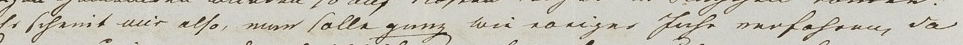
Es scheint mir also, man solle ganz wie voriges Jahr verfahren, da
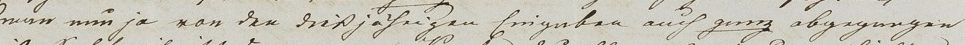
man nun ja von den dießjährigen Eingaben auch ganz abgegangen
